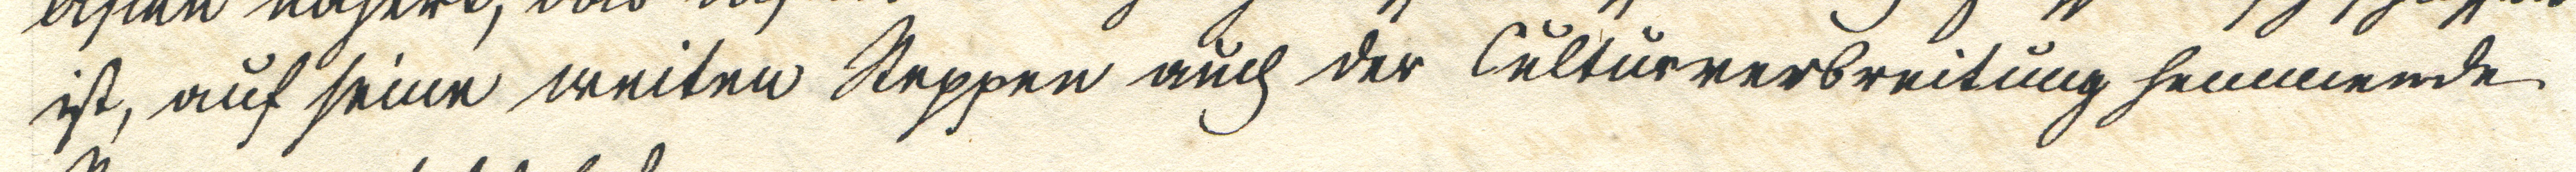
ist, auf seine weiten Steppen auch der Culturverbreitung hemmende
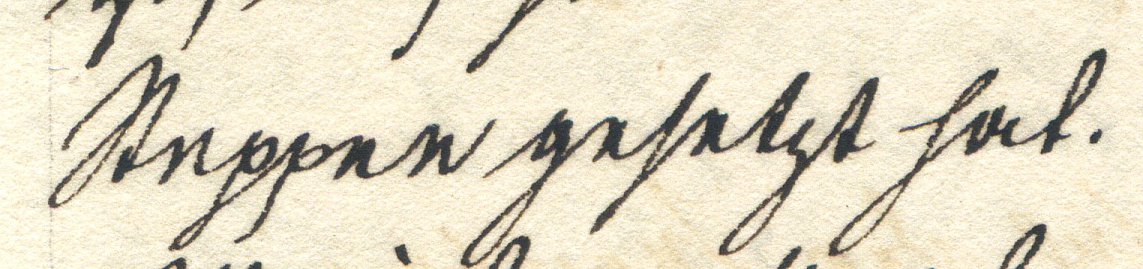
Steppen gesetzt hat.
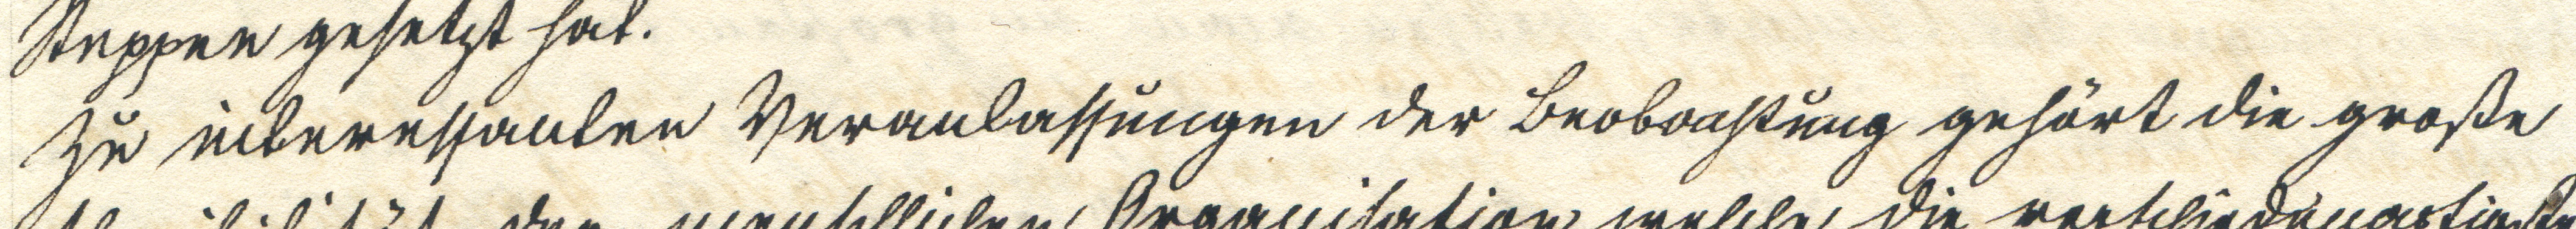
Zu interessanten Veranlassungen der Beobachtung gehört die große
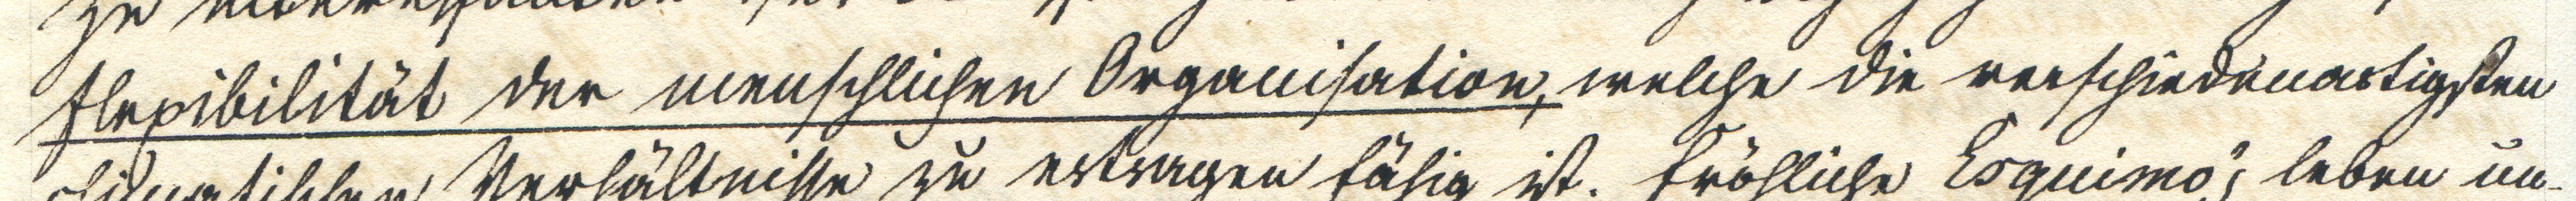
Flexibilität der menschlichen Organisation, welche die verschiedenartigsten
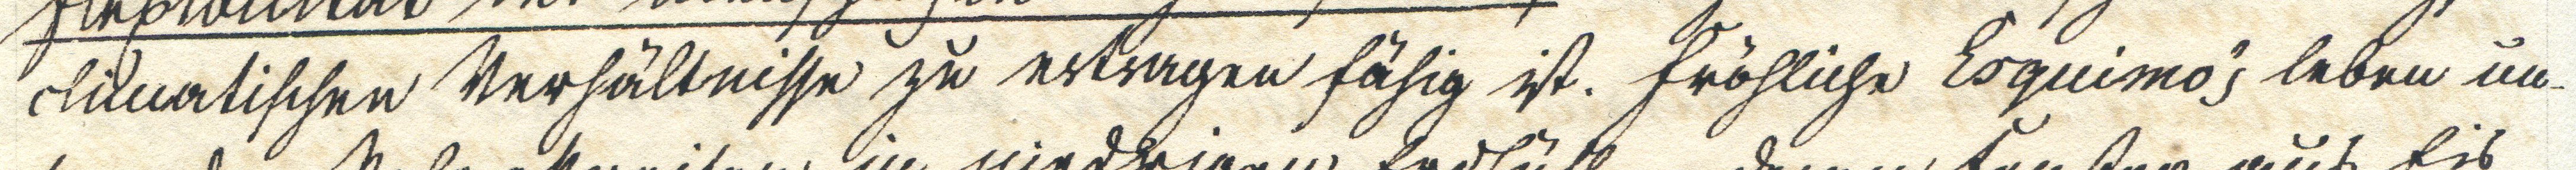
climatischen Verhältnisse zu ertragen fähig ist. Fröhliche Esquimo’s leben un-
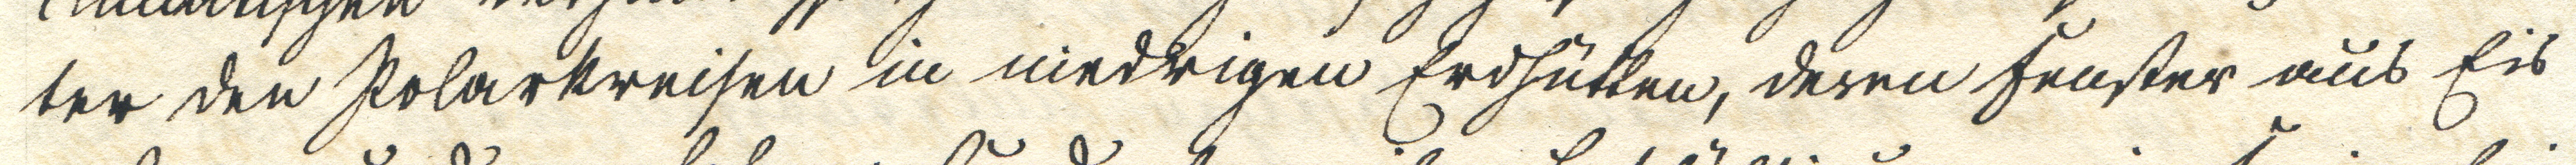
ter den Polarkreisen in niedrigen Erdhütten, deren Fenster aus Eis
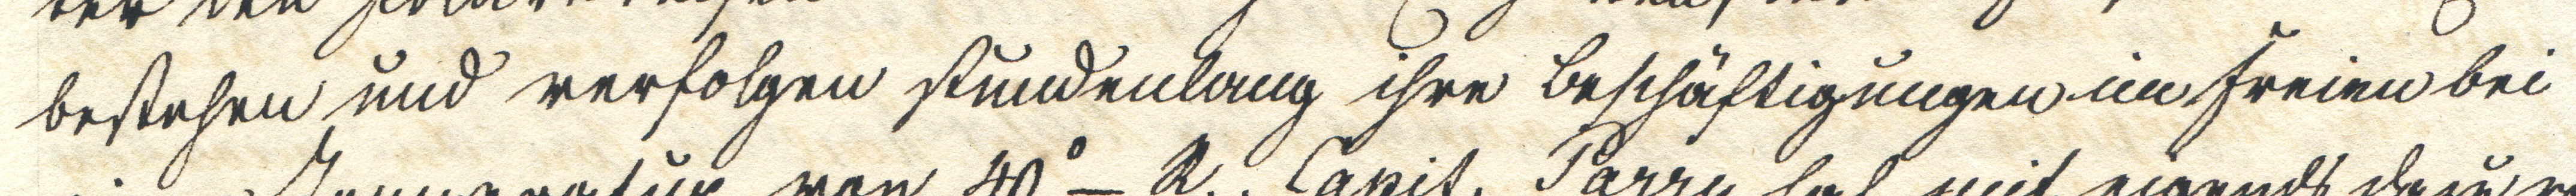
bestehen und verfolgen stundenlang ihre Beschäftigungen im Freien bei
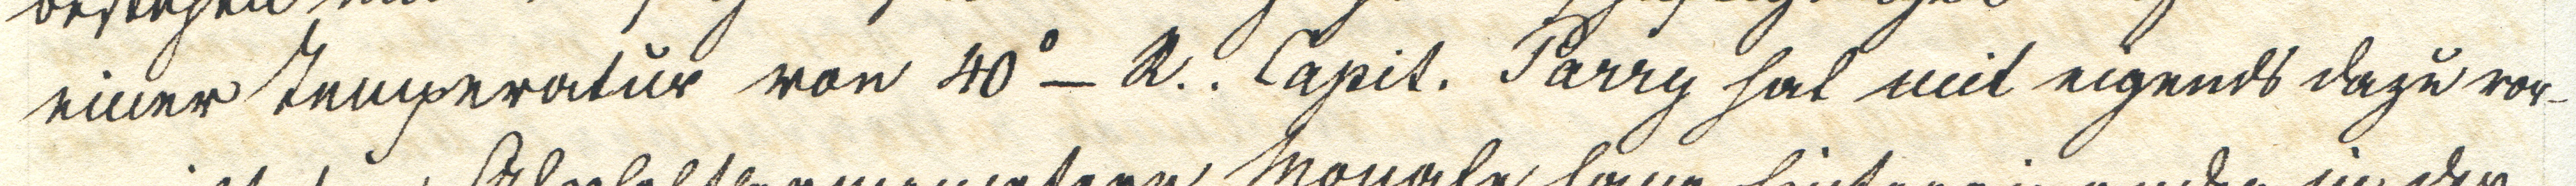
einer Temperatur von 40°− R. Capit. Parry hat mit eigends dazu vor-
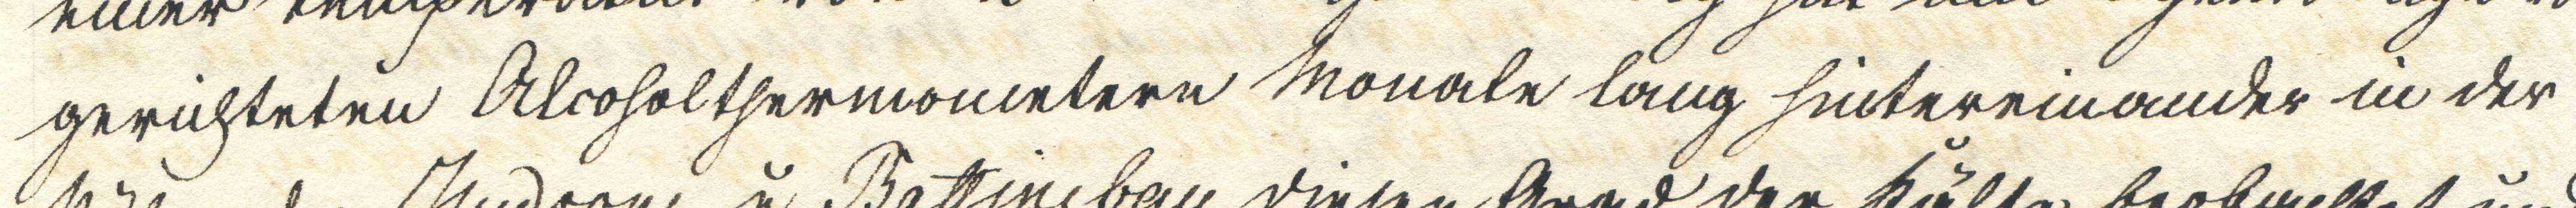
gerichteten Alcoholthermometern Monate lang hintereinander in der
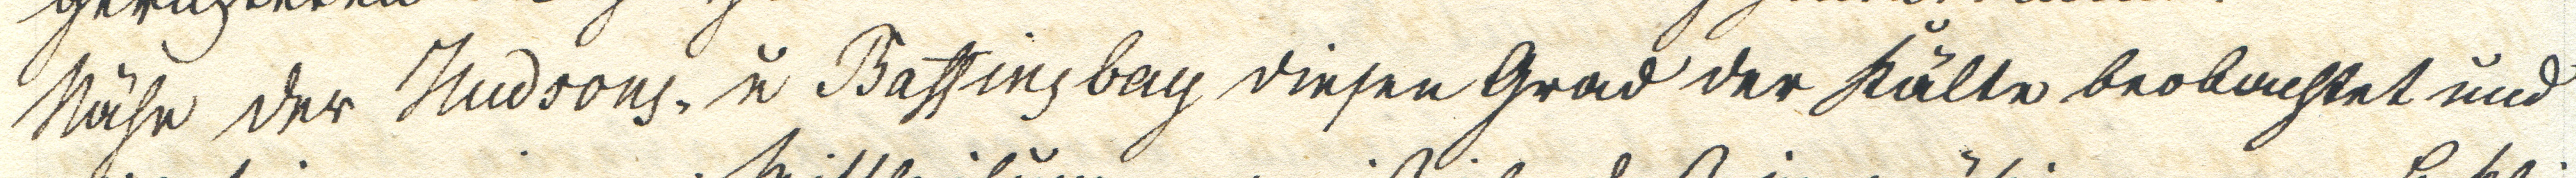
Nähe der Hudsons- u Baffinsbay diesen Grad der Kälte beobachtet und
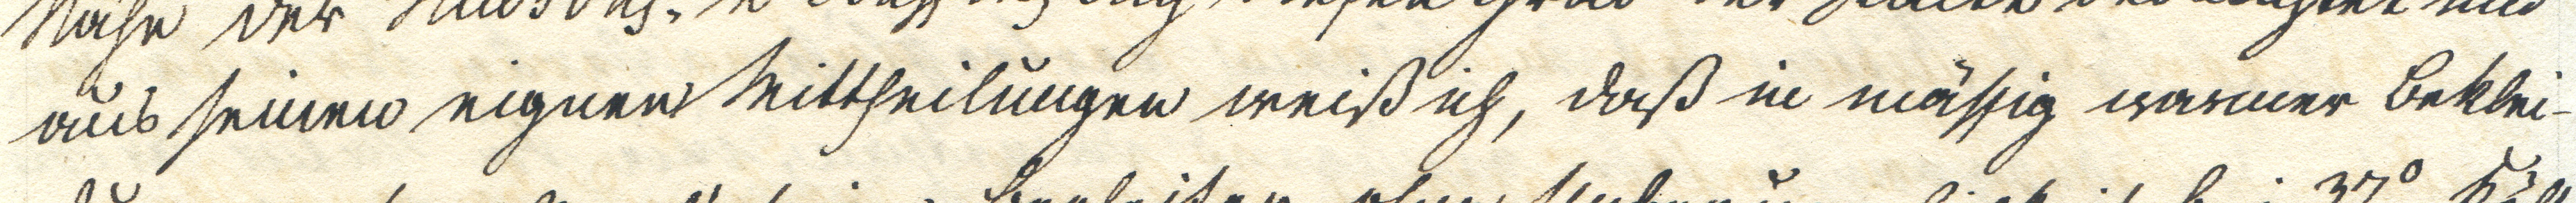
aus seinen eignen Mittheilungen weiß ich, daß in mässig warmer Beklei-
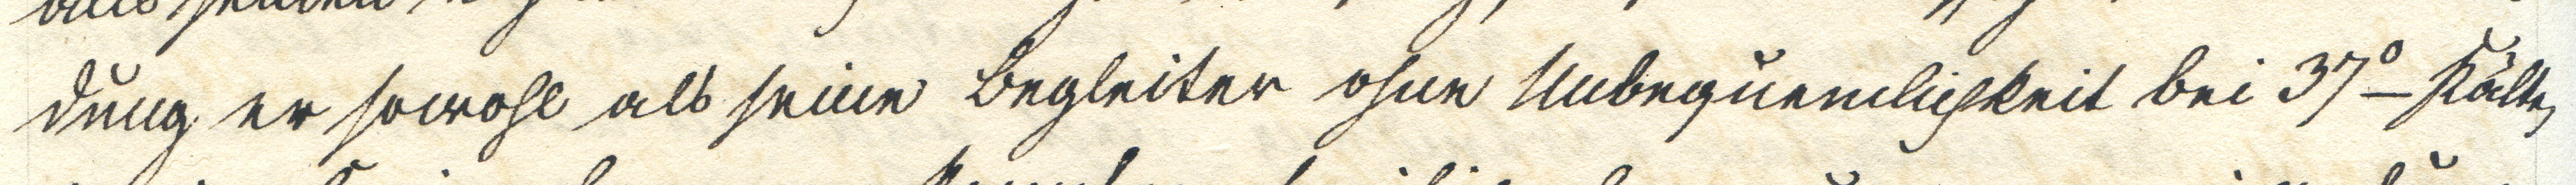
dung er sowohl als seine Begleiter ohne Unbequemlichkeit bei 37°− Kälte,
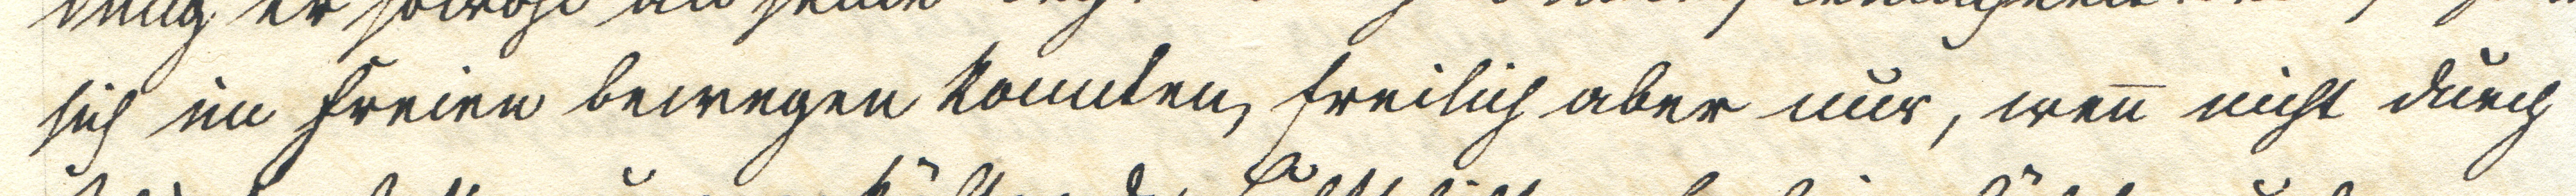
sich im Freien bewegen konnten, freilich aber nur weñ nicht durch
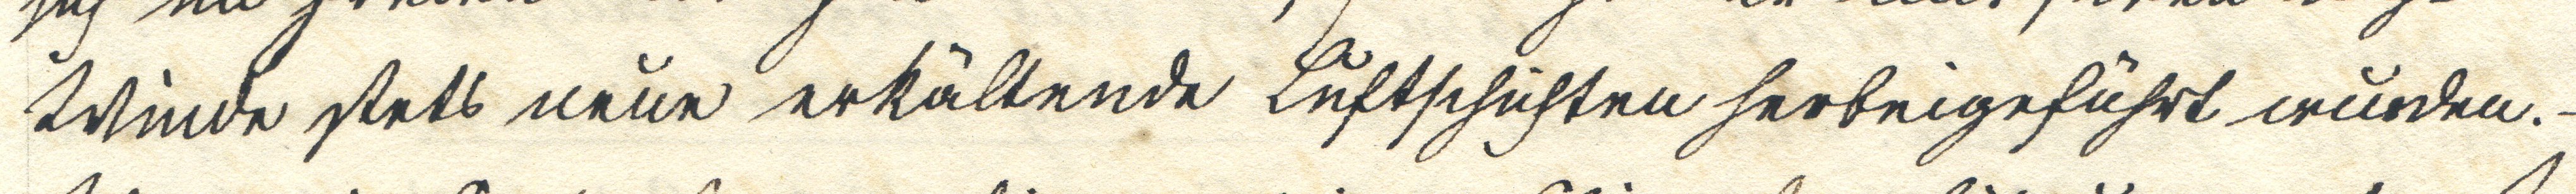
Winde stets neue erkältende Luftschichten herbeigeführt wurden. –
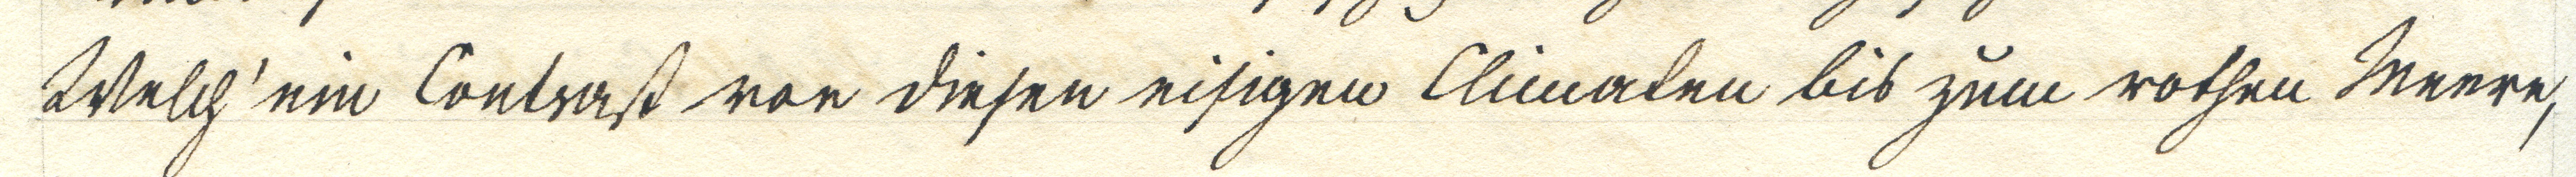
Welch’ ein Contrast von diesen eisigen Climaten bis zum rothen Meere,
